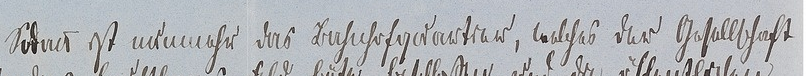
Sodann ist nunmehr das Bahnhofquartier, welches der Gesellschaft
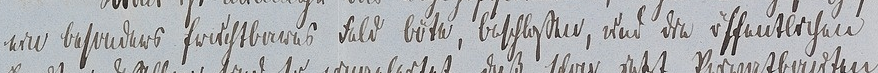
ein besonders fruchtbares Feld böte, beschlossen, und die öffentlichen
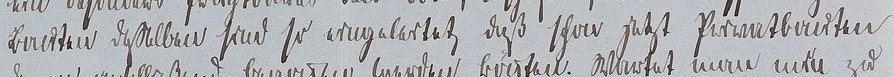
Bauten desselben sind so eingeleitet, daß schon jetzt Privatbauten
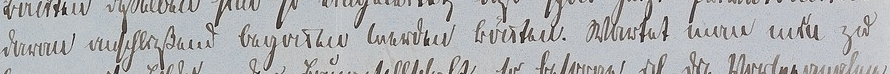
daran anschließend begonnen werden könnten. Wartet man nun zu
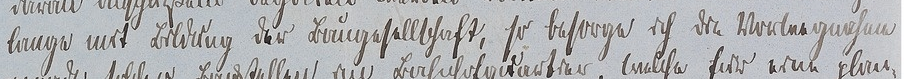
lange mit Bildung der Baugesellschaft, so besorge ich die Vorwegnahme
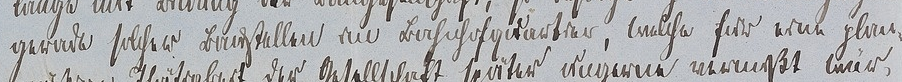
gerade solcher Baustellen im Bahnhofquartier, welche für eine plan-
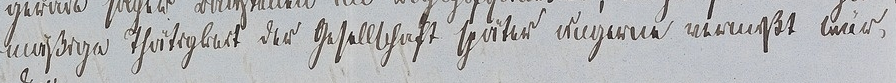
mäßige Thätigkeit der Gesellschaft später ungerne vermißt wür-
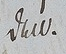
den.
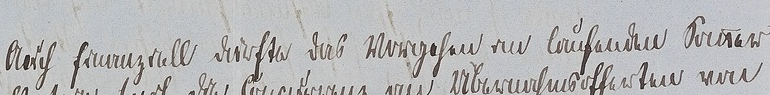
Auch finanziell dürfte das Vorgehen im laufenden Sommer
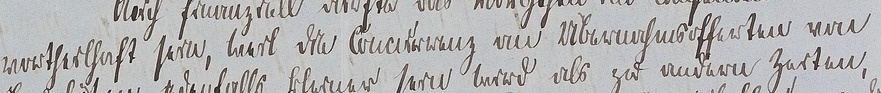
vortheilhaft sein, weil die Concurrenz an Übernahmsofferten von
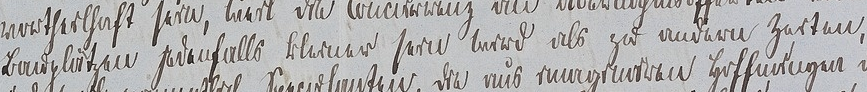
Bauplätzen jedenfalls kleiner sein wird als zu andern Zeiten,
